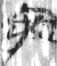寅
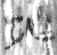卯
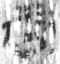晨
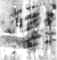是
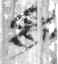{胃刀}（謂）
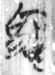○（陰）
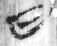日
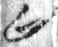㠯
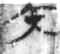內（入）
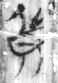貨
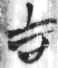吉
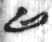㠯（以）
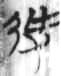{尸拃}（作）
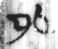卯
